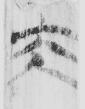夫
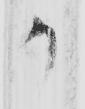人
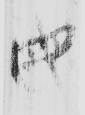母
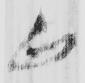㠯（以）
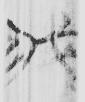我
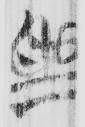爲
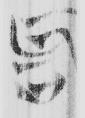{㠯ㅋ}
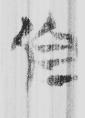於
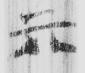亓
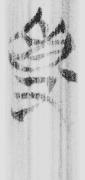事
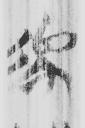虎
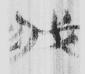我
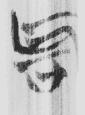{㠯ㅋ}
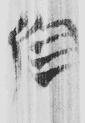於
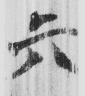亓
